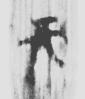亓
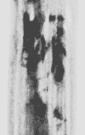所
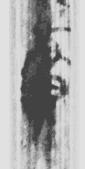貴
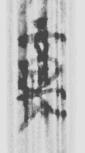奠
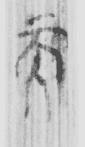而
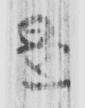是
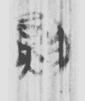則
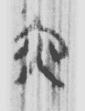亦
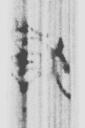猶
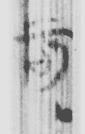可
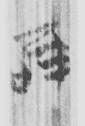唯
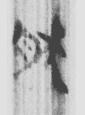肰
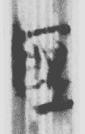聖
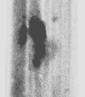人
